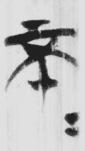不=
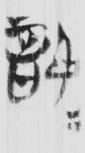言身=
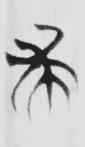求
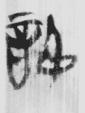{言身}
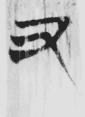又
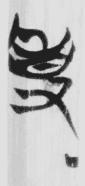事
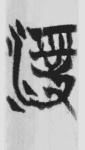{水丵又}
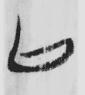㠯（以）
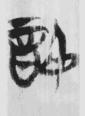{言身}
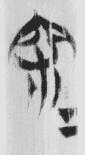罙=
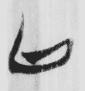㠯（以）
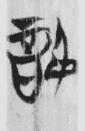{言身}
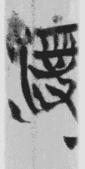{水丵又}
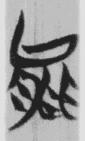能
